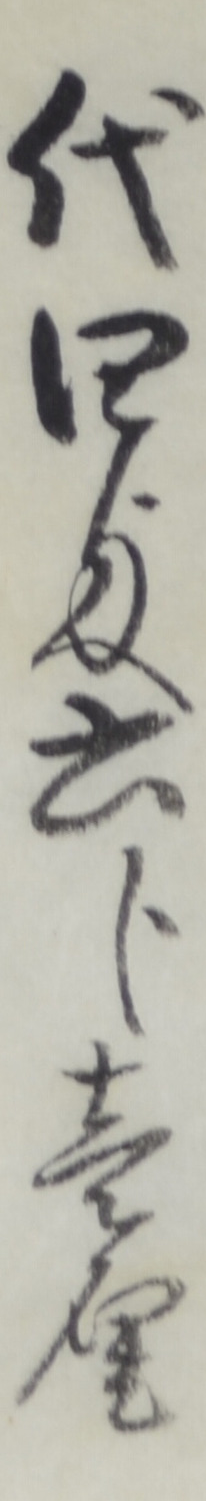代四匁六分壱厘
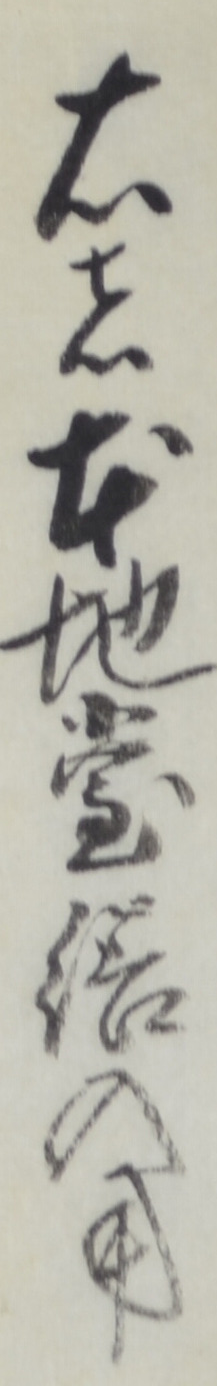右は本地堂繕入用
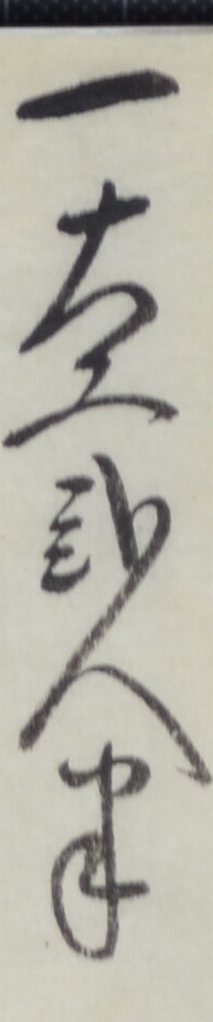一大工弐人半
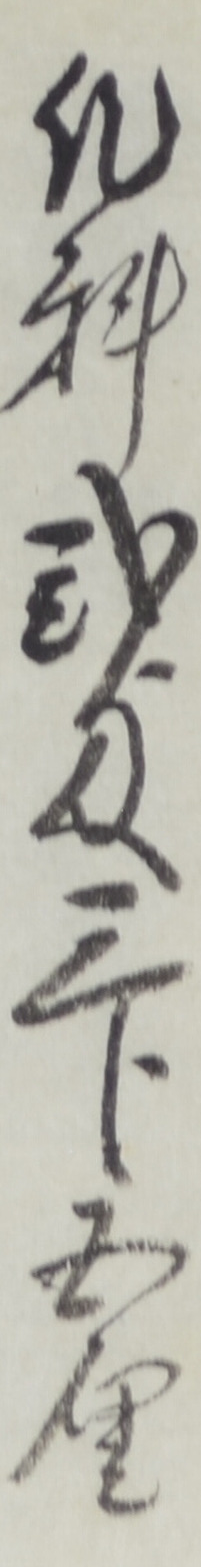作料弐匁三分五厘
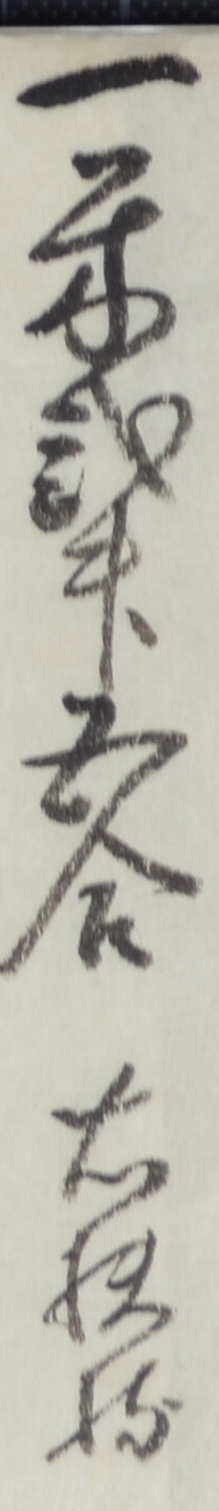一米弐升五合右扶持
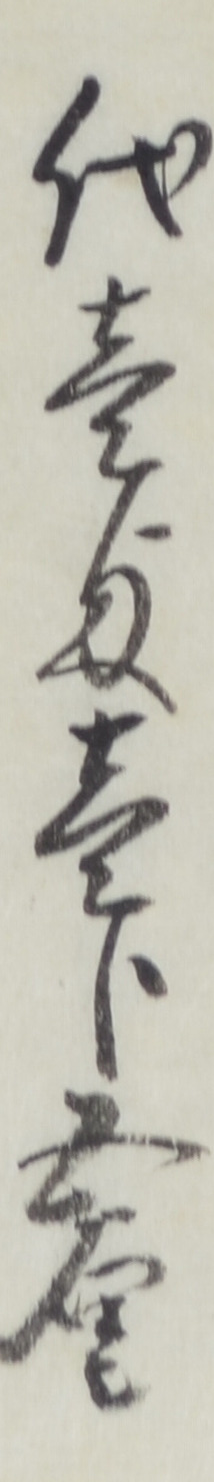代壱匁壱分五厘
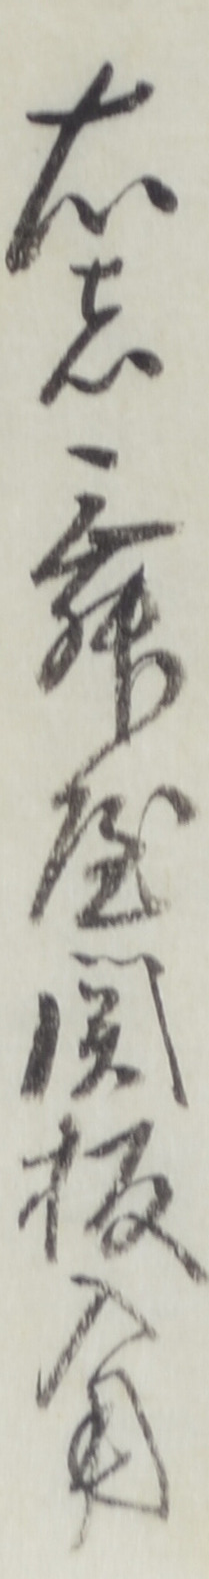右は三升屋関板入用
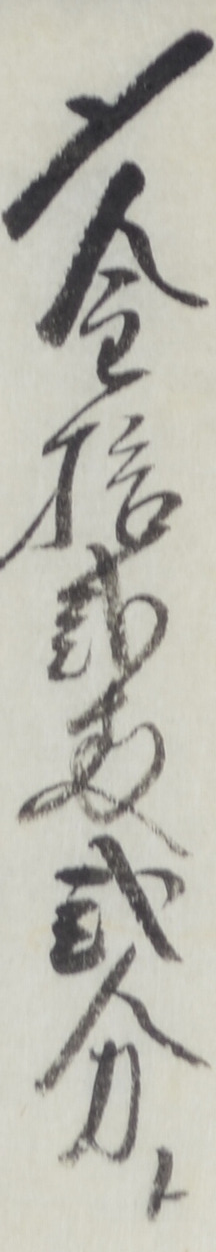〆金拾弐両弐分ト
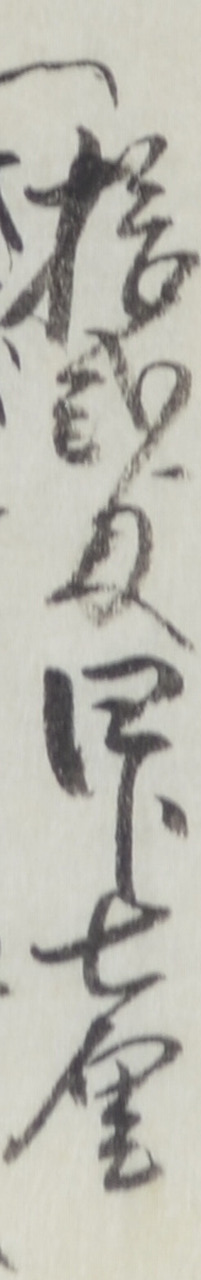拾弐匁四分七厘
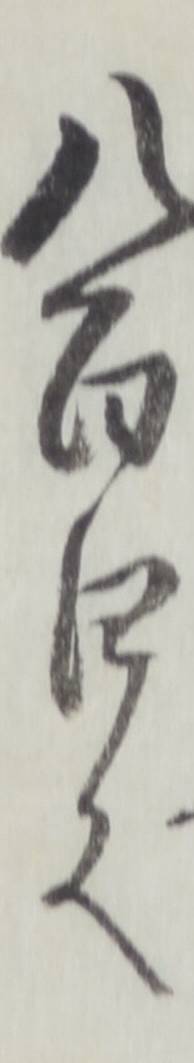八百四文
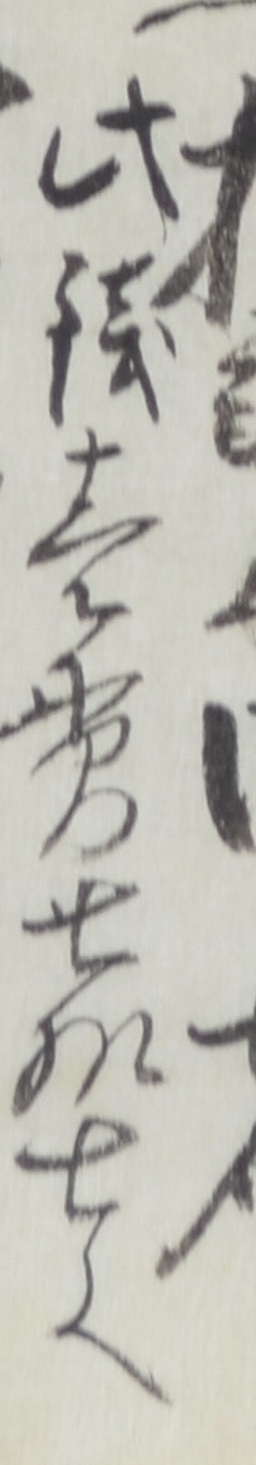此銭壱貫七拾七文
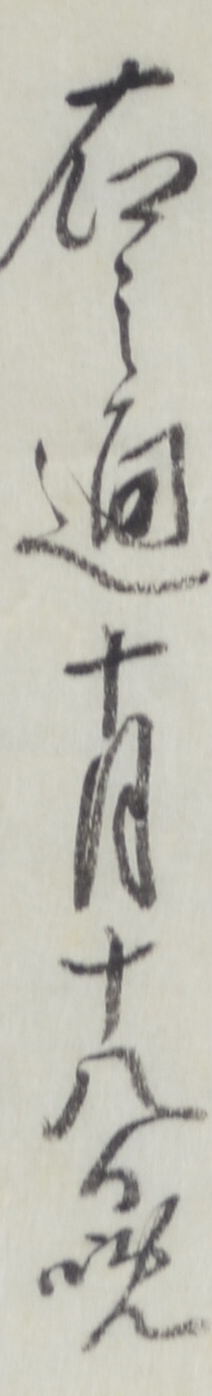右之通十月十八日晩
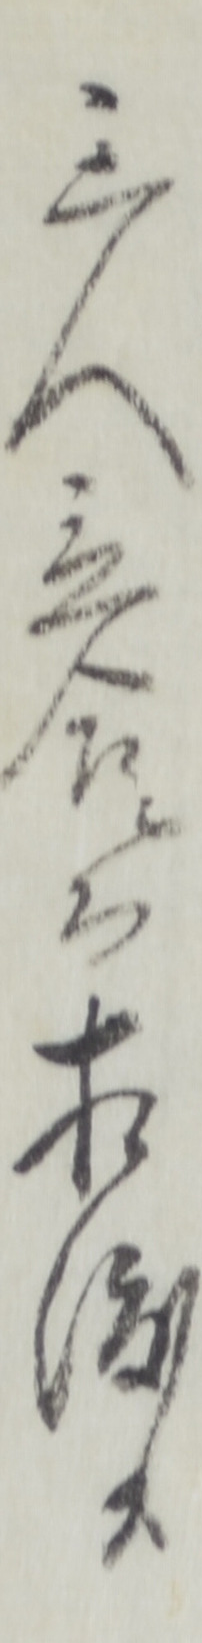三人立合ニ而相渡候
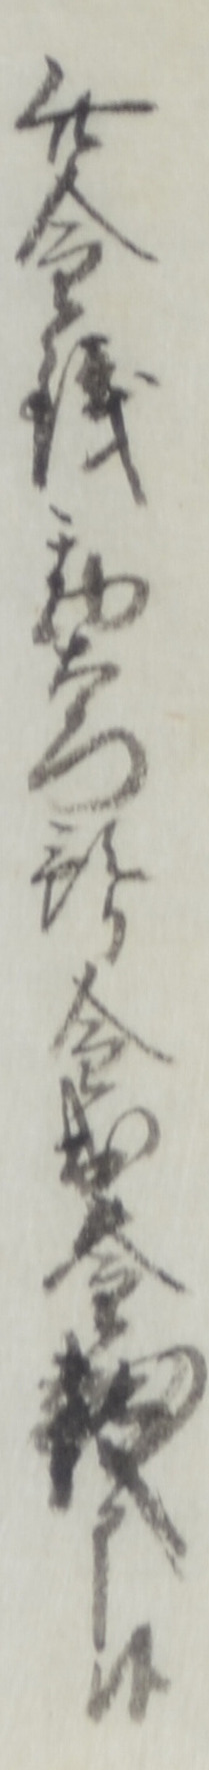此金銭勘右衛門預り金出金致申候

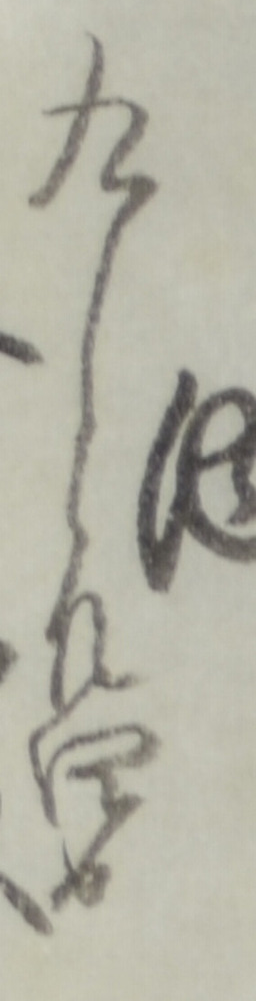九月廿四日
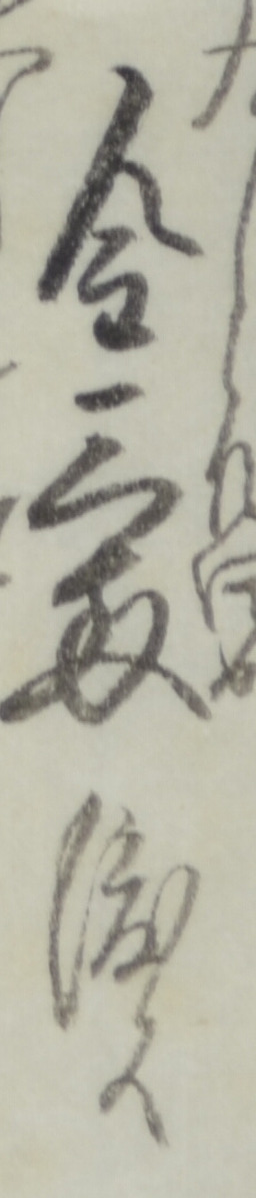金三両渡ス
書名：権現分拂方
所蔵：伊那市立高遠町図書館・合同会社AMANE
